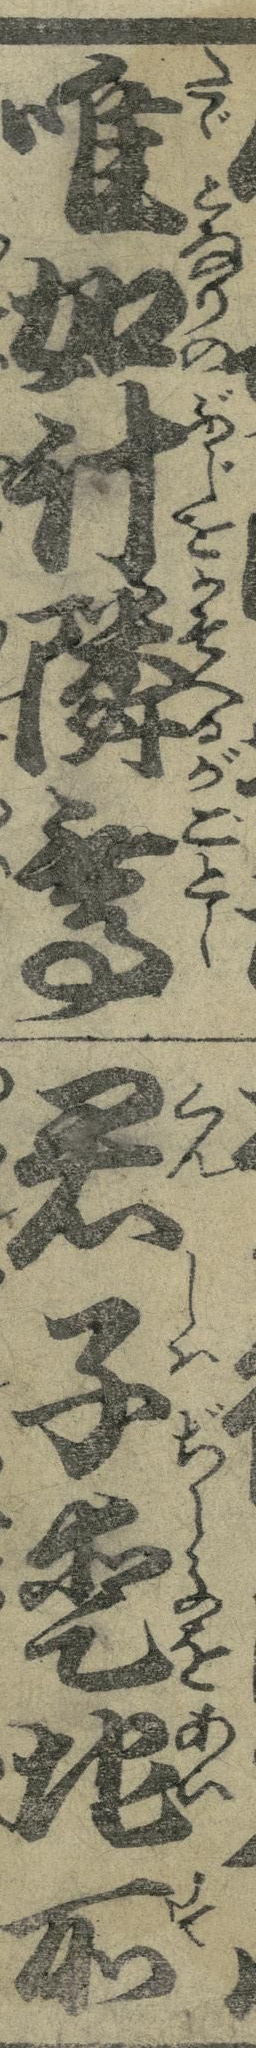唯如計隣無事君子愛地所
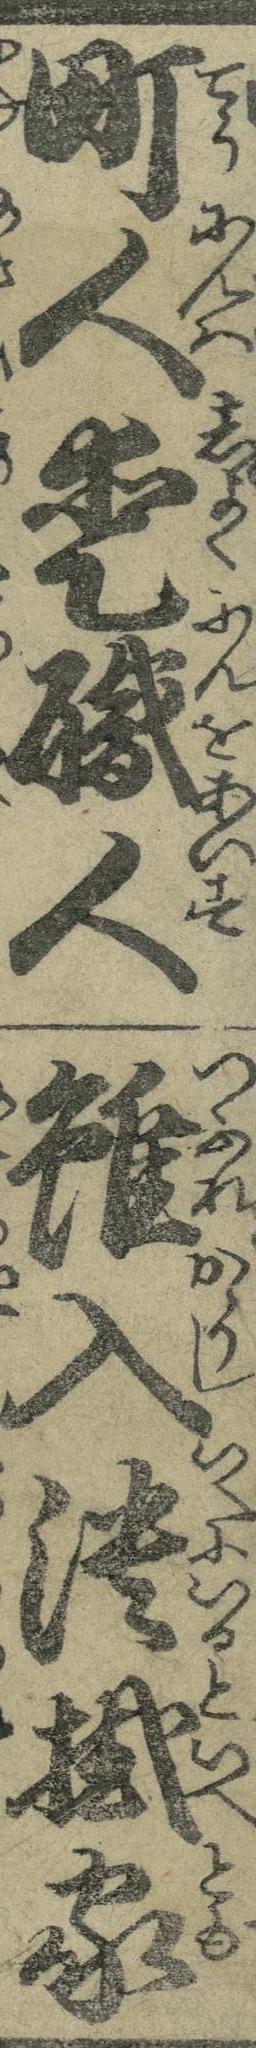町人愛職人雖入潰掛家
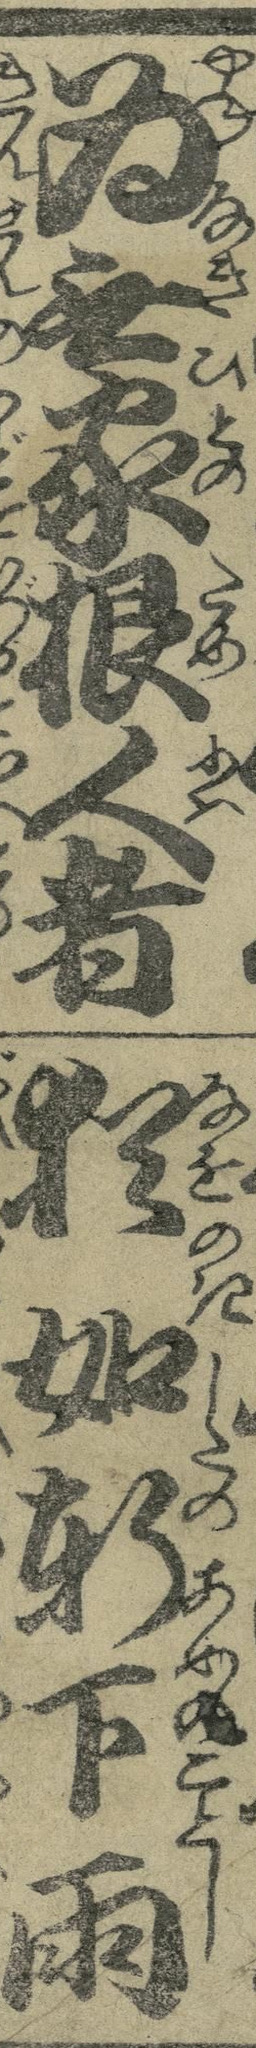為無家根人者猶如軒下雨
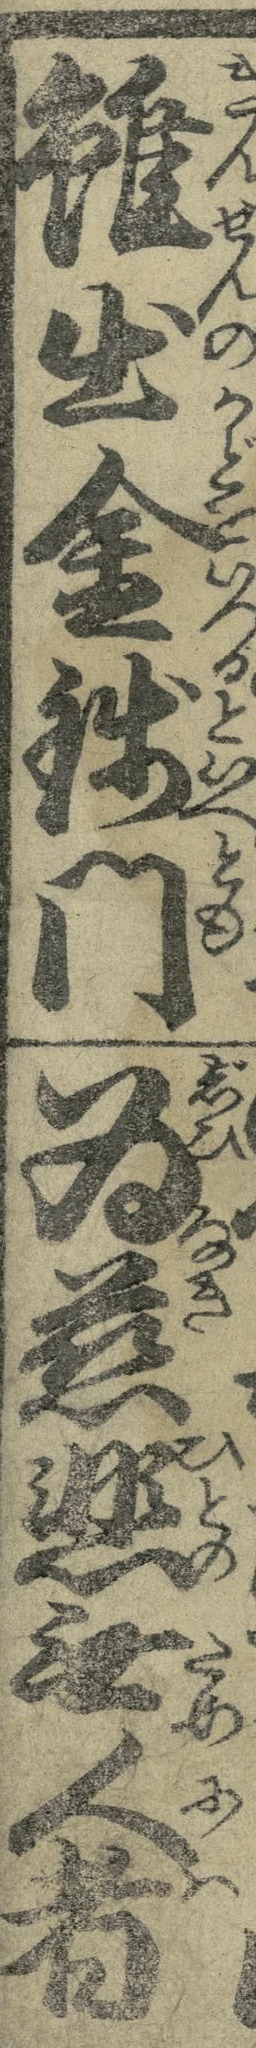雖出金銭門為慈悲無人者
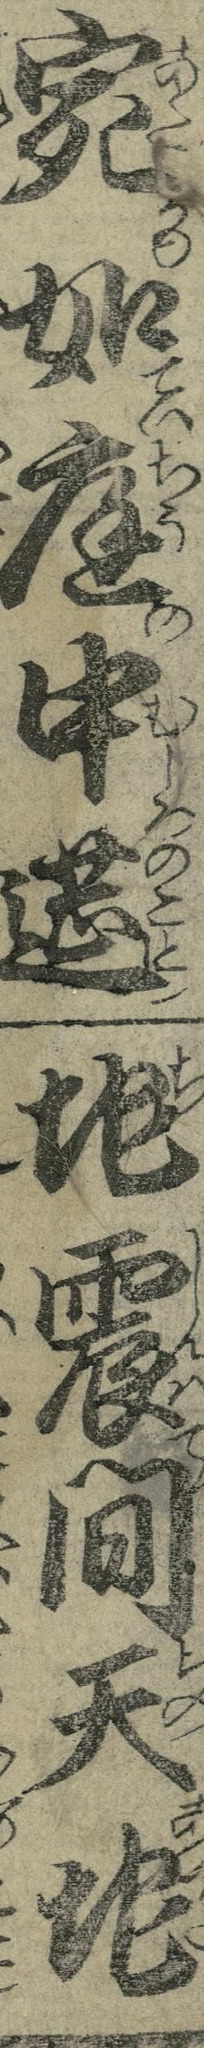宛如庭中筵地震間天地
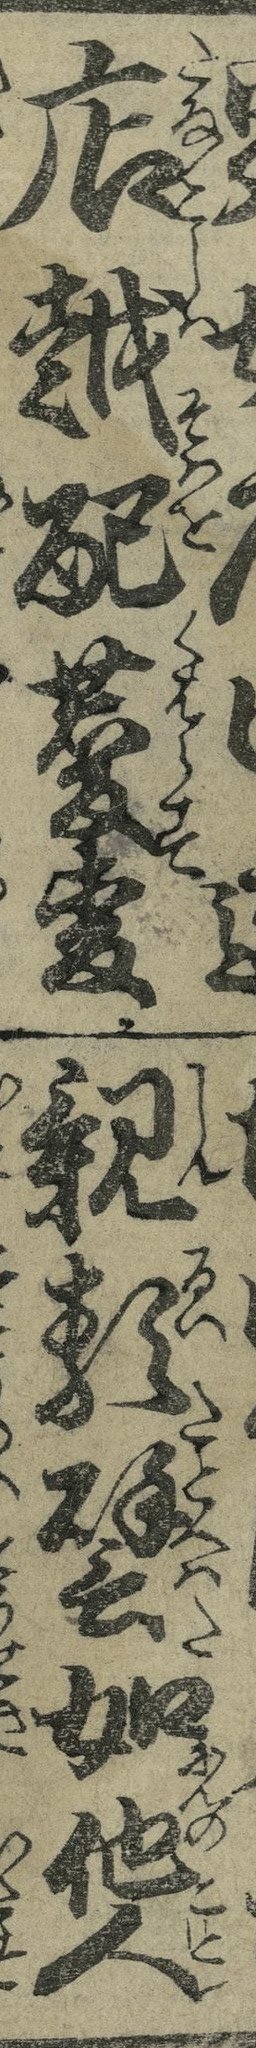店越配蕎麦親類譬如他人
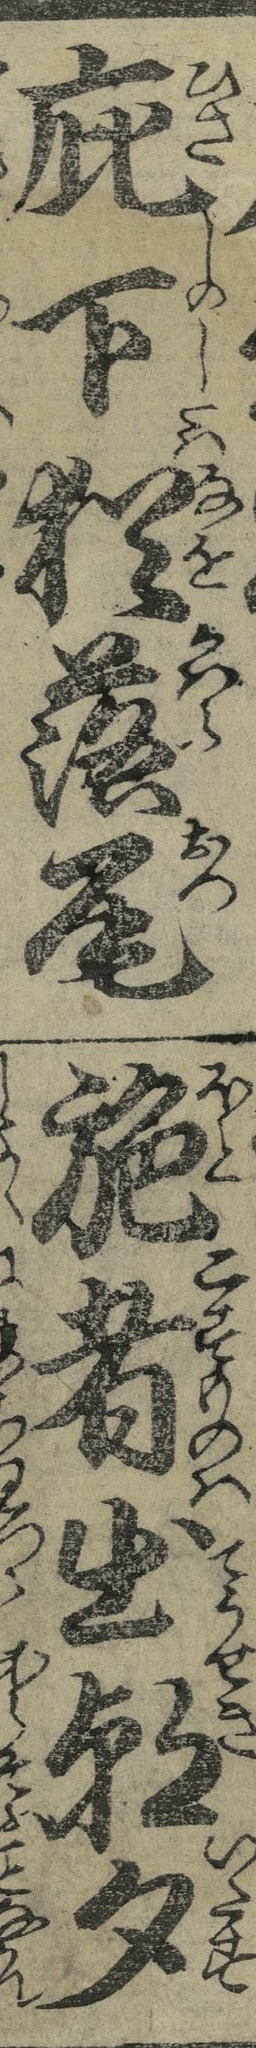庇下猶落瓦施者出朝夕
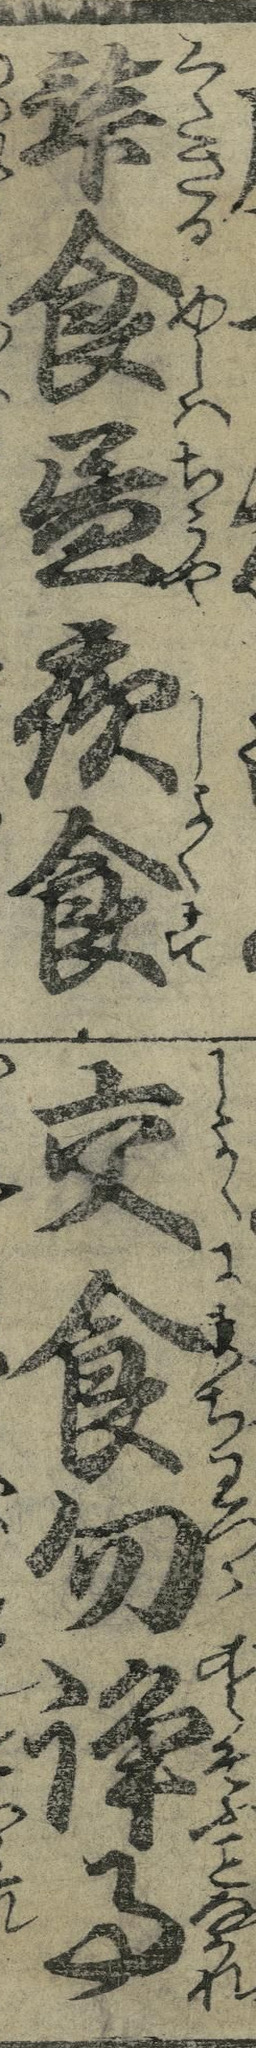被下食昼夜食交食勿諍事
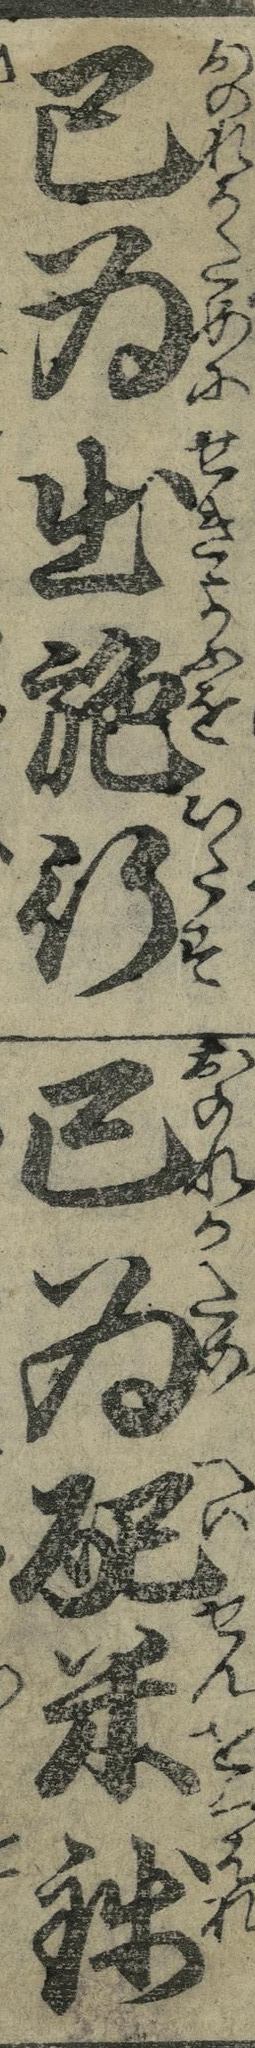己為出施行己為配米銭
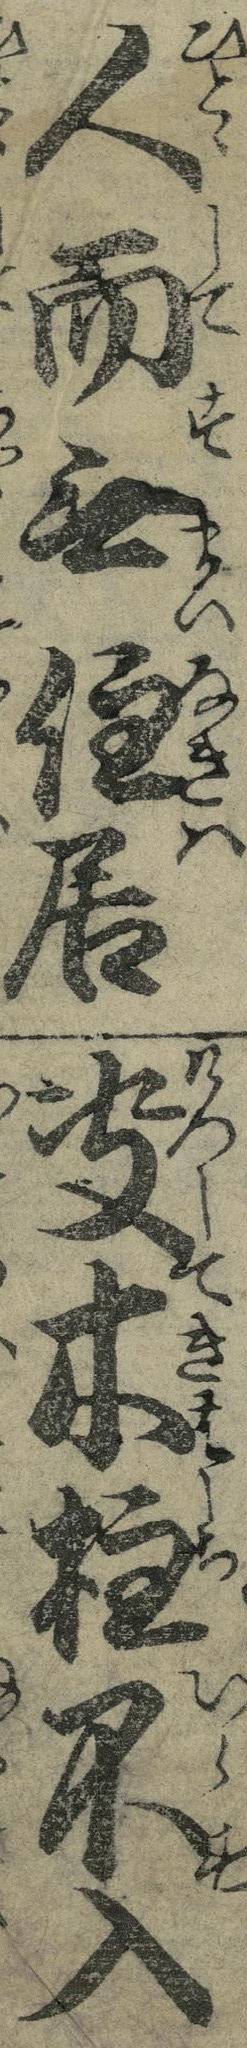人而無住居決木柱不入
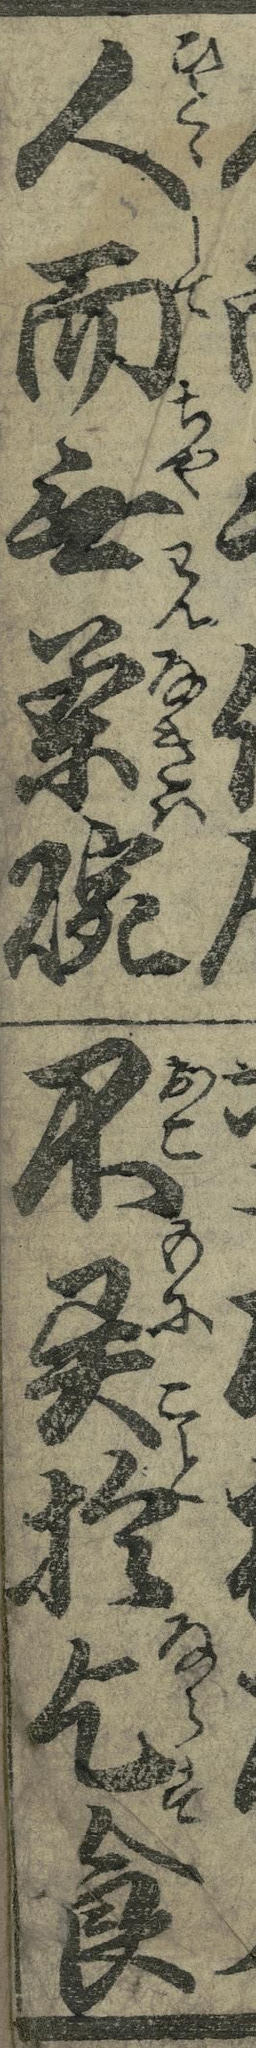人而無茶碗不異於乞食

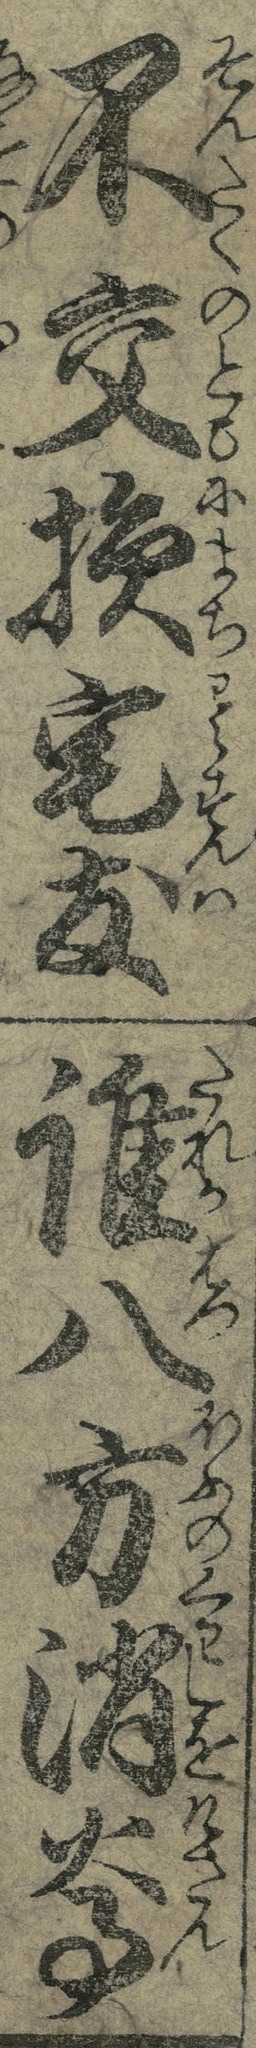不交損宅友誰八方消火事
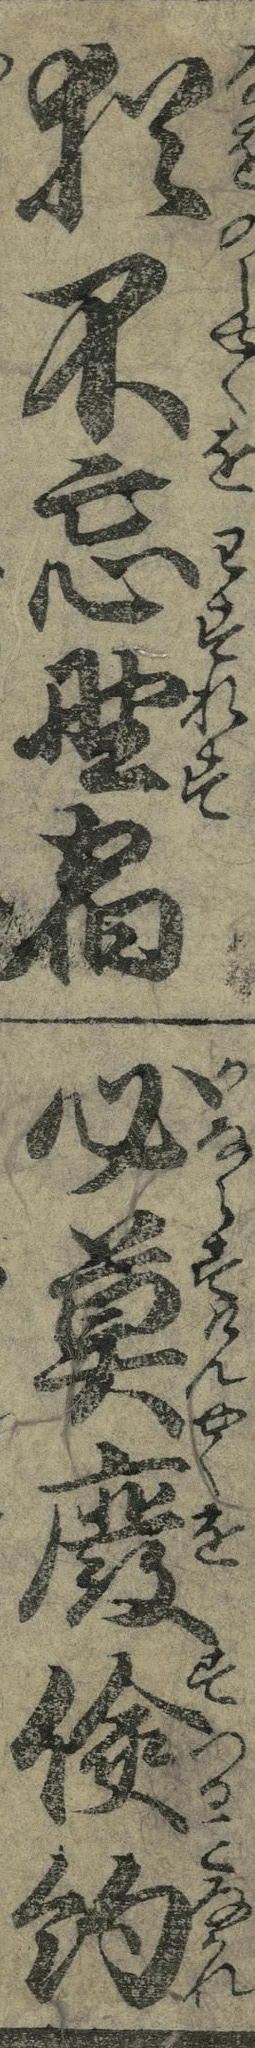猶不忘野宿必莫廃倹約
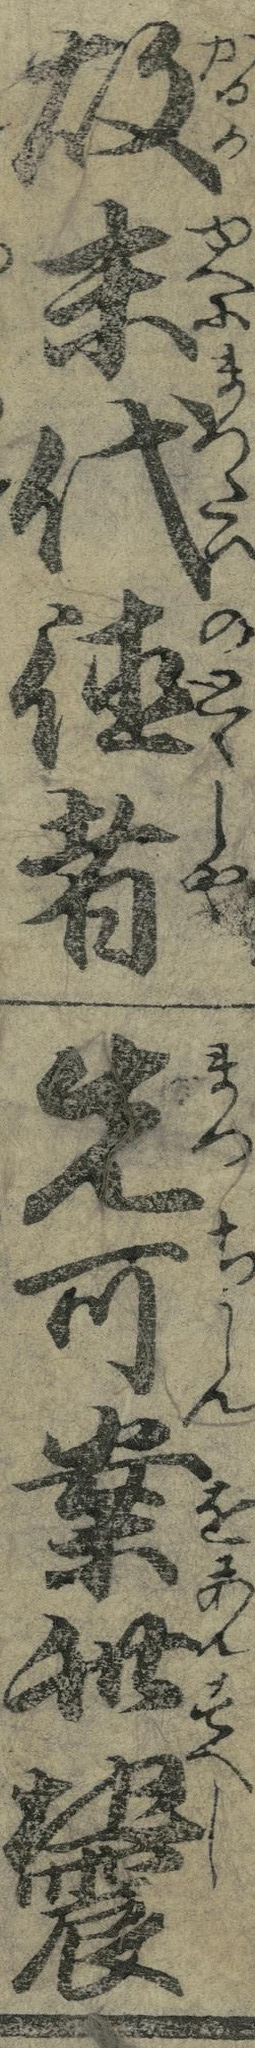故末代徳者先可案地震
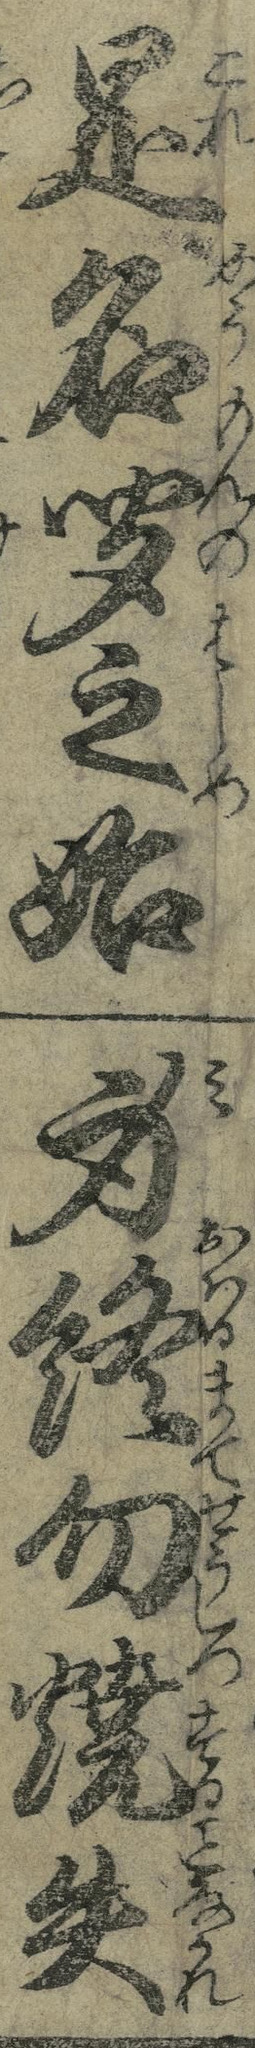是名聞之始身終勿焼失
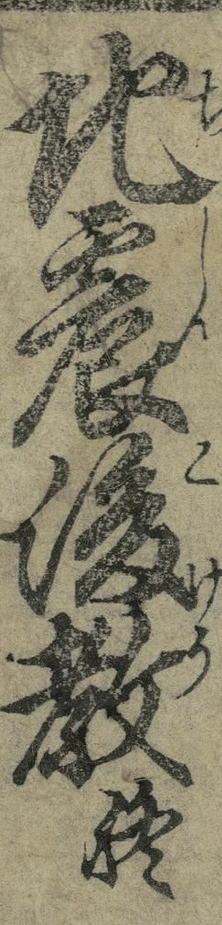地震後教終
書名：大江戸　地震後教　人事改正　平かな附
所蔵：東京大学地震研究所図書室 Earthquake Research Institute Library, The University of Tokyo, JAPAN
